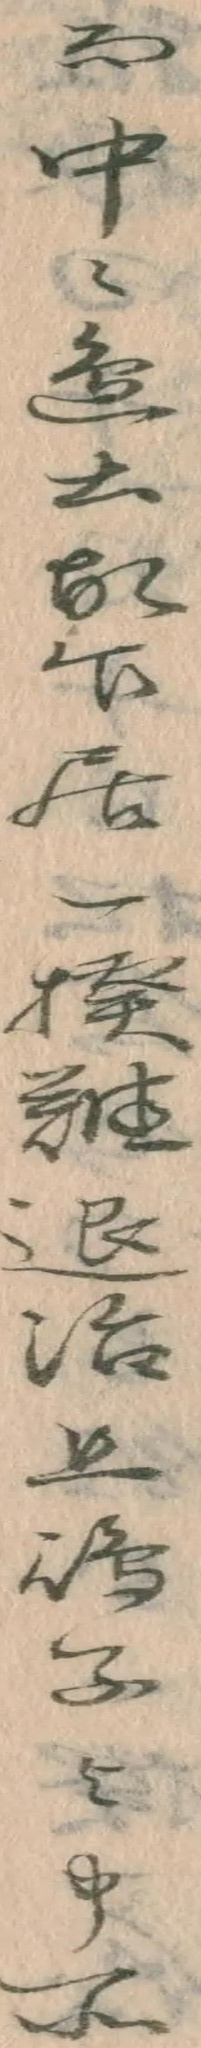而中々辺土故乍居一揆難退治且島子与申所
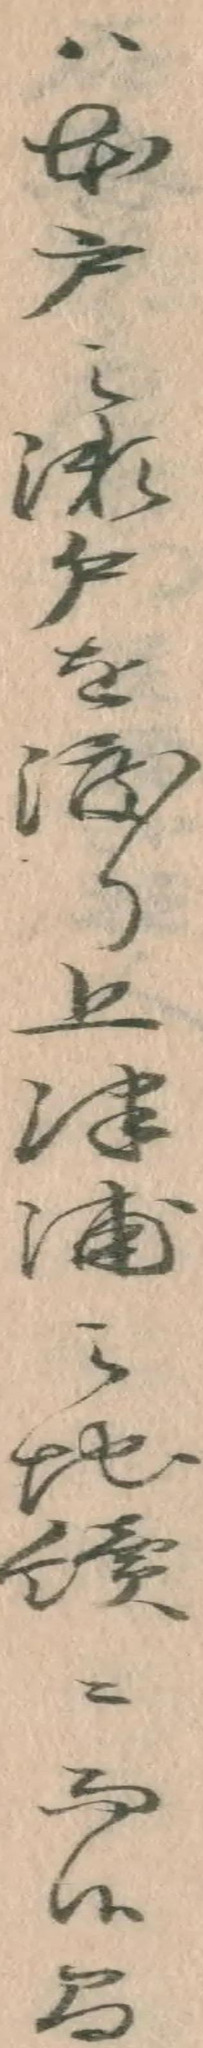は本戸之瀬戸を渡り上津浦之地続に而候間
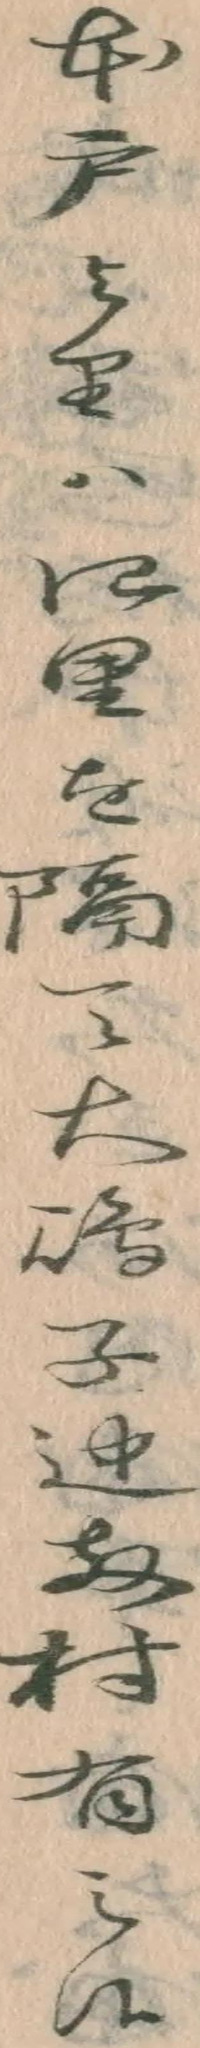本戸与里は四里を隔て大島子迚両村有之候
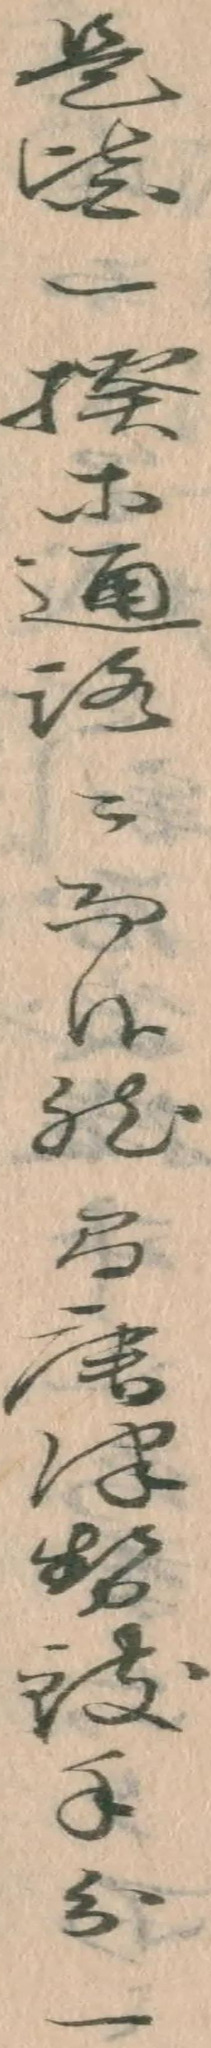是皆一揆等通路に而候然間唐津勢致手分一
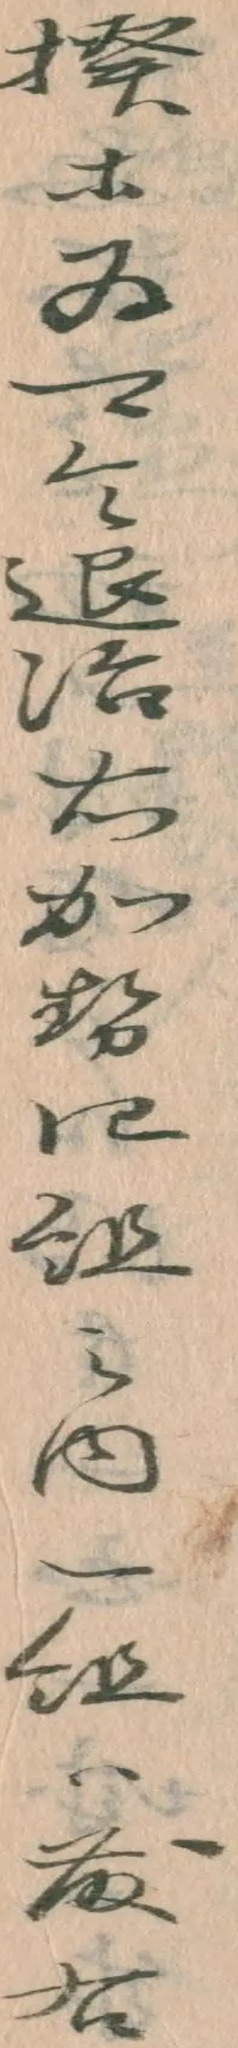揆等ゐ可令退治右加勢四組之内一組は藤右
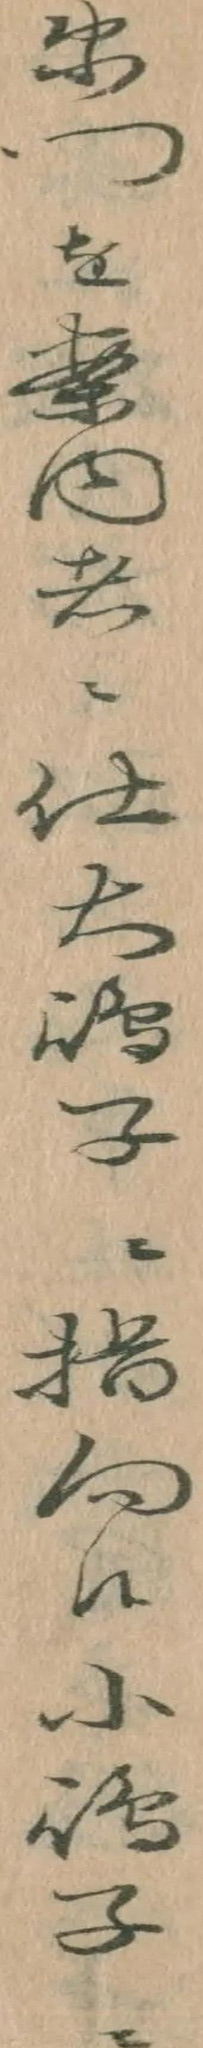衛門を案内者に仕大島子に揚向候小島子に
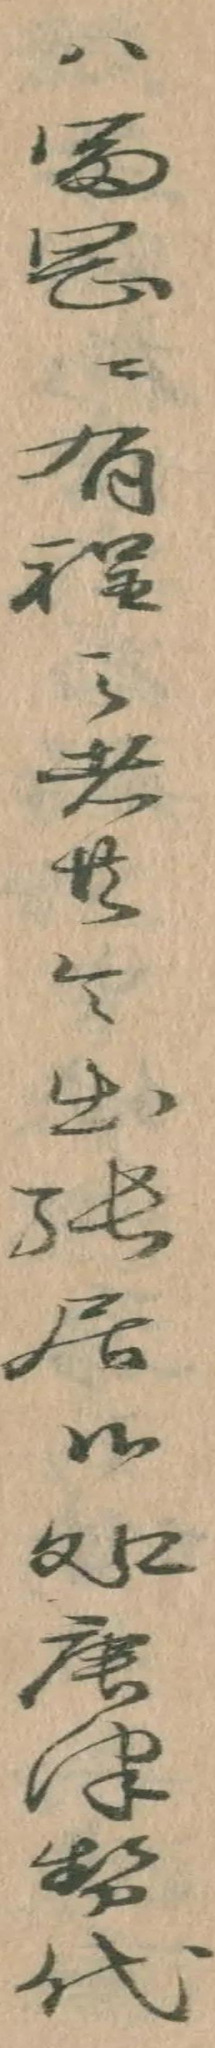は冨岡に有程之者共令出張居候処唐津勢代
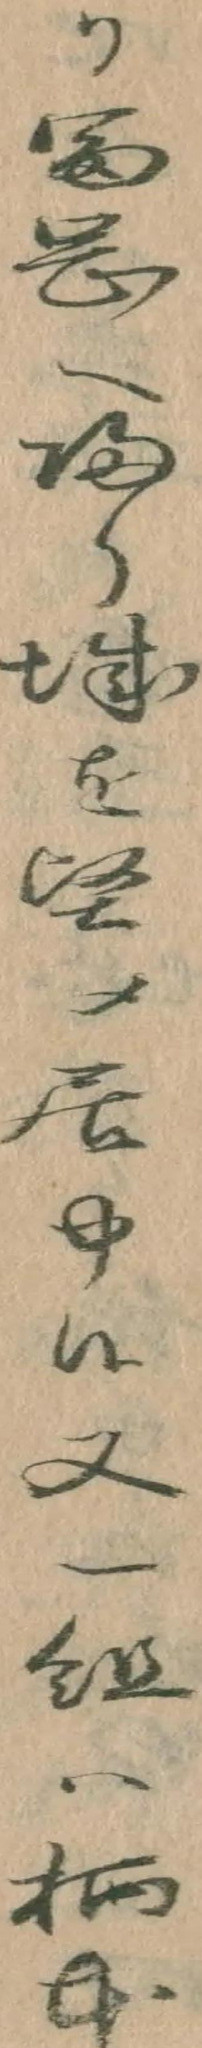り冨岡へ帰り城を堅め居申候又一組は栖本
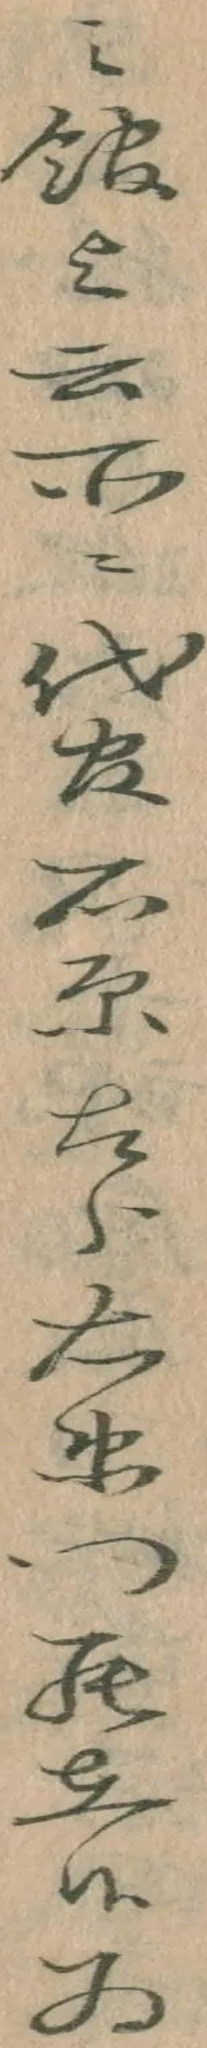之館与云所に代官石原太郎右衛門罷在候ゐ
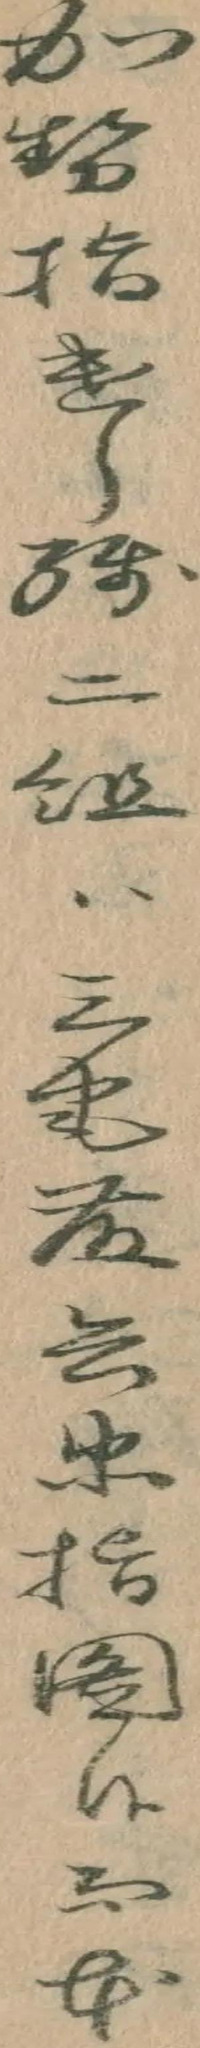加勢指遣し残二組は三宅藤兵衛指図候而本
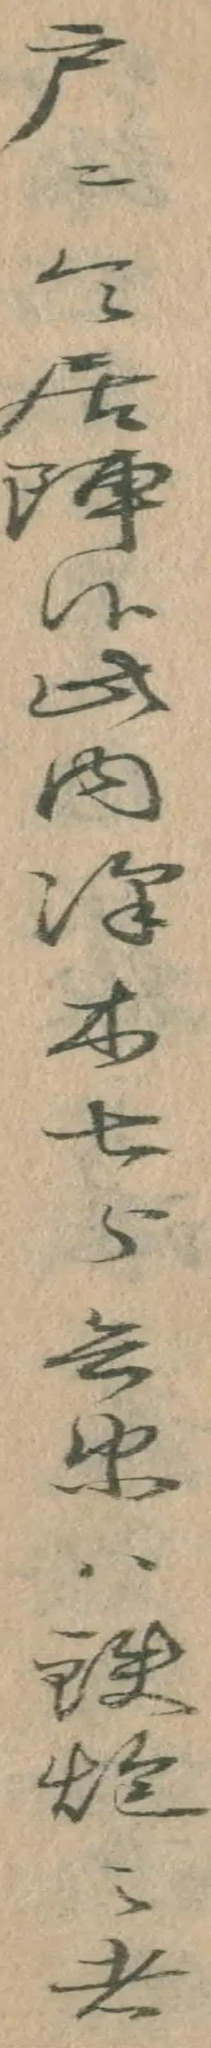戸に令居陣候此内沢木七郎兵衛は鉄炮之者
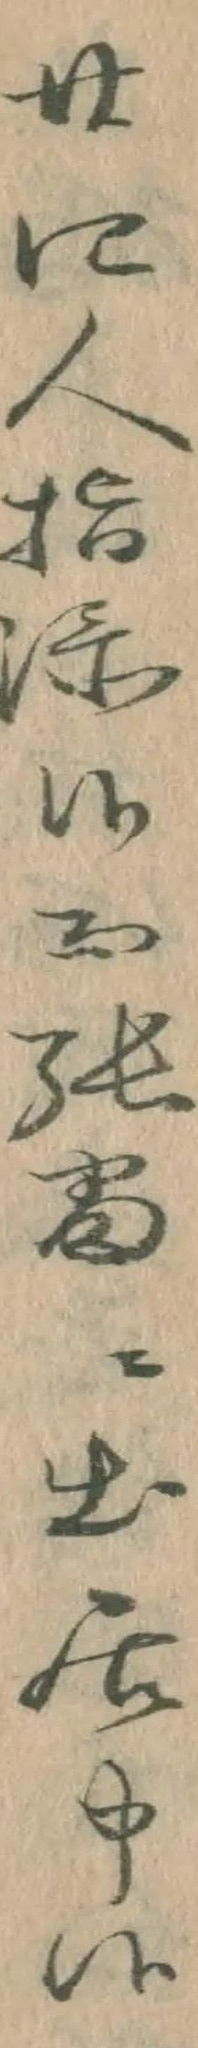廿四人指添候而張番に出居申候
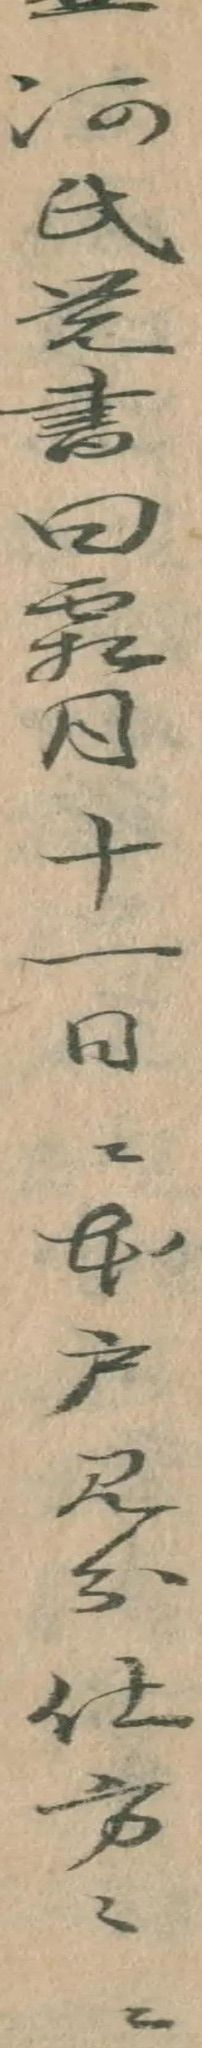並河氏覚書曰霜月十一日に本戸見分仕方々に
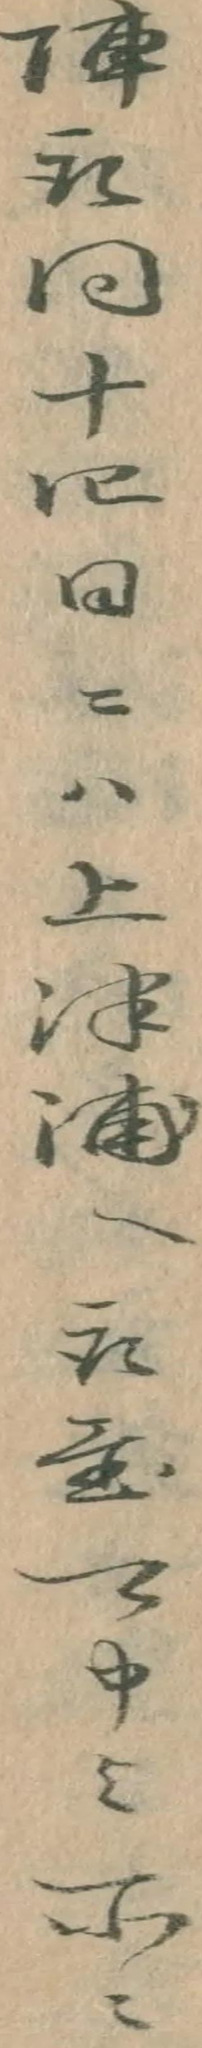陣取同十四日には上津浦へ取置可申与所々
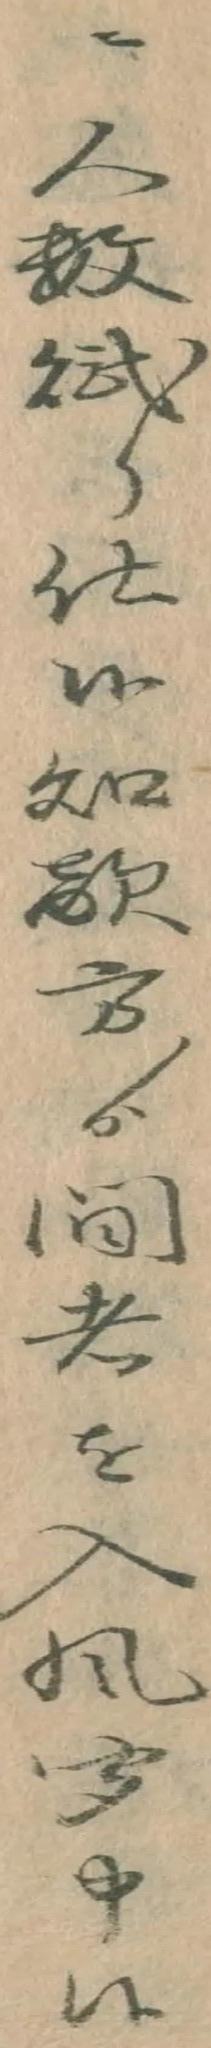に人数賦り仕候処敵方ゟ間者を入風聞申候

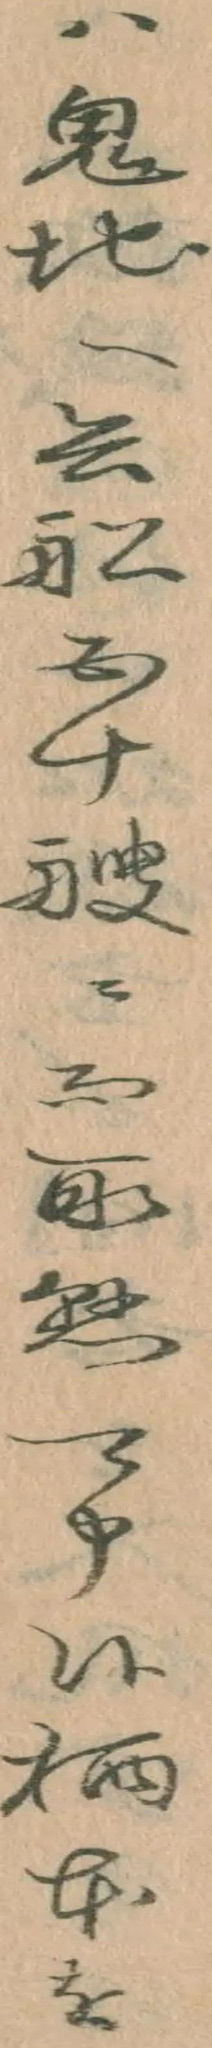は鬼地へ兵舩五十艘に而取懸て申候栖本を
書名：切支丹御退治記 49巻. [2]
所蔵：国立国会図書館 National Diet Library, JAPAN
